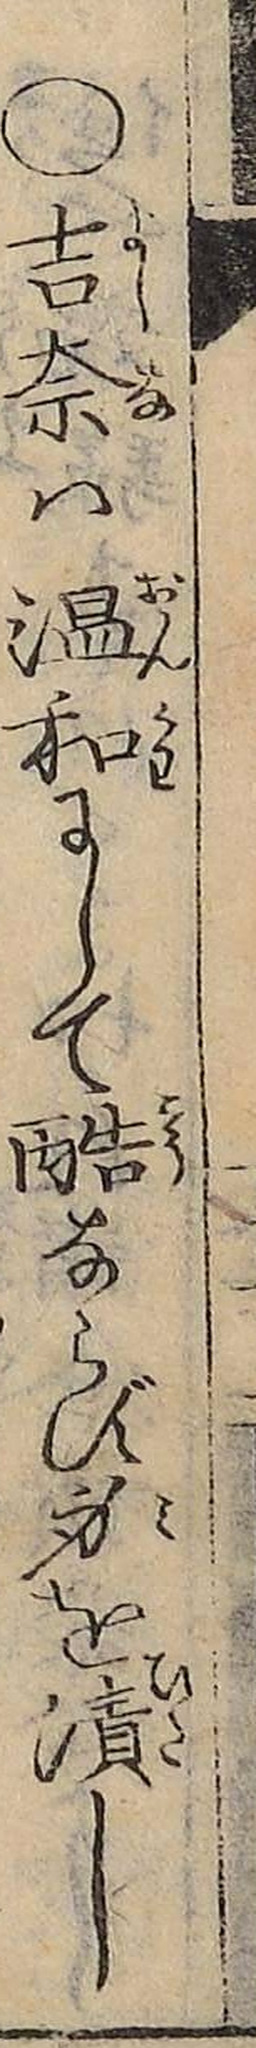○吉奈は温和にして酷ならず身を漬し
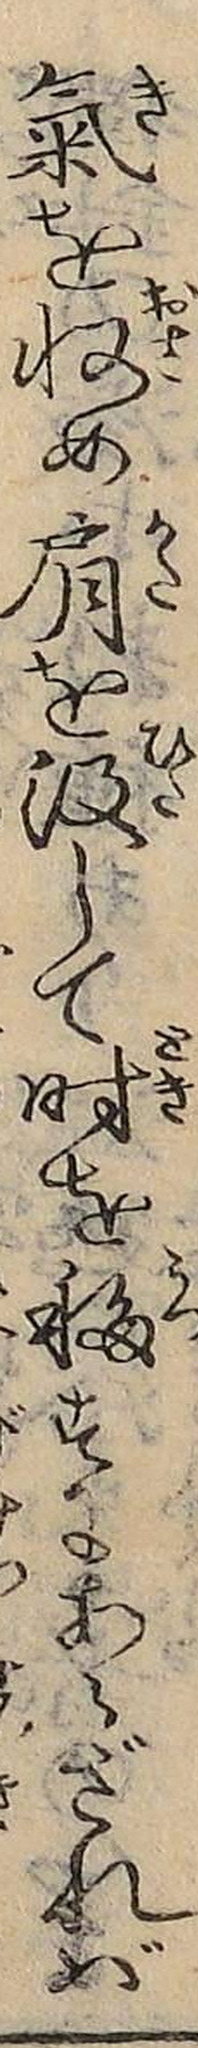気を収め肩を汲して時を移すにあらざれば
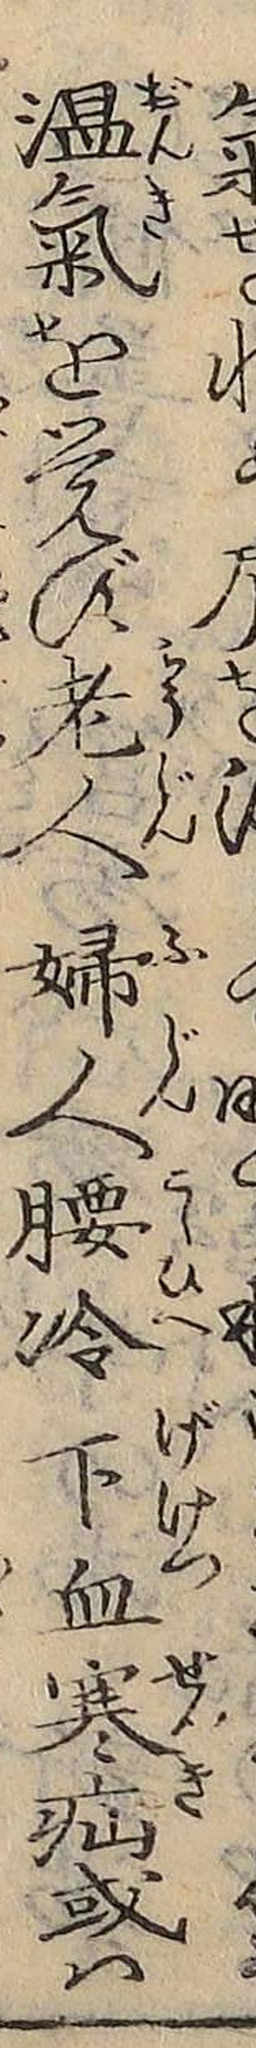温気を覚び老人婦人腰冷下血寒疝或は
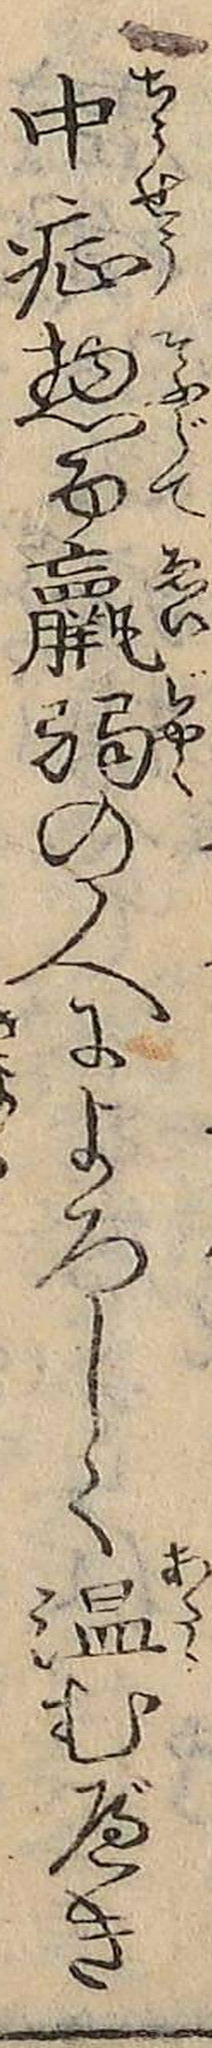中症惣而羸弱の人によろしく温むべき
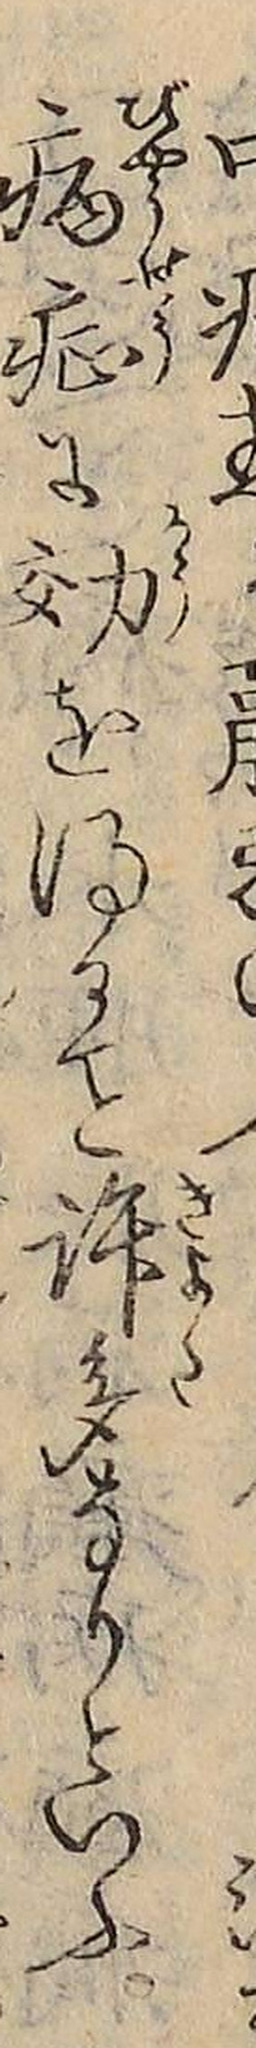病症に効を得ること許多なりといふ
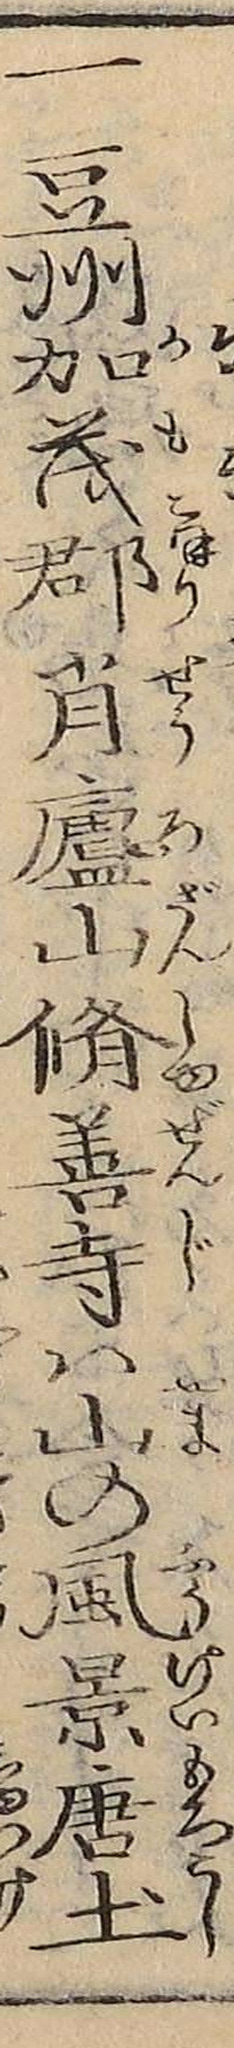一豆州加茂郡肖盧山脩善寺は山の風景唐土
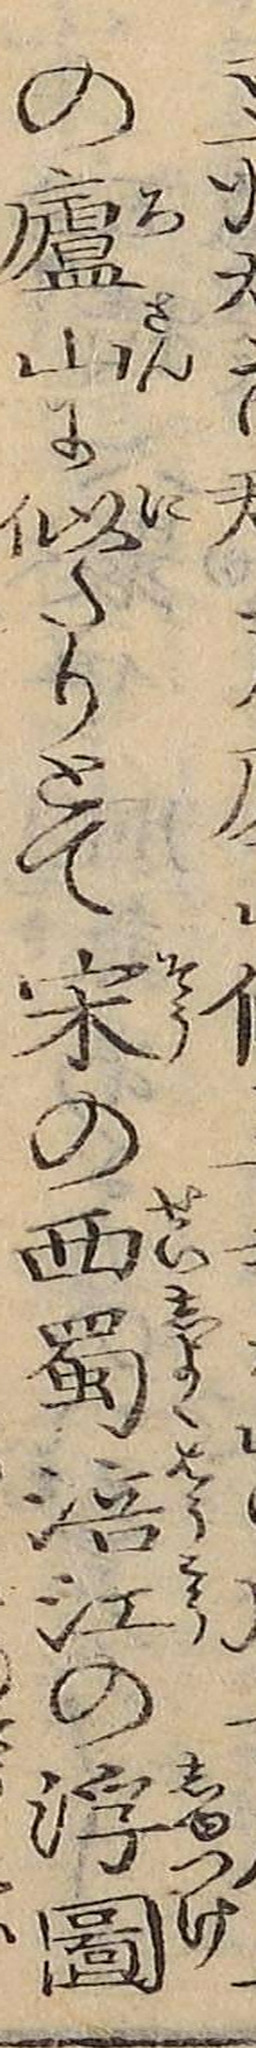の盧山に似たりとて宋の西蜀涪江の浮図
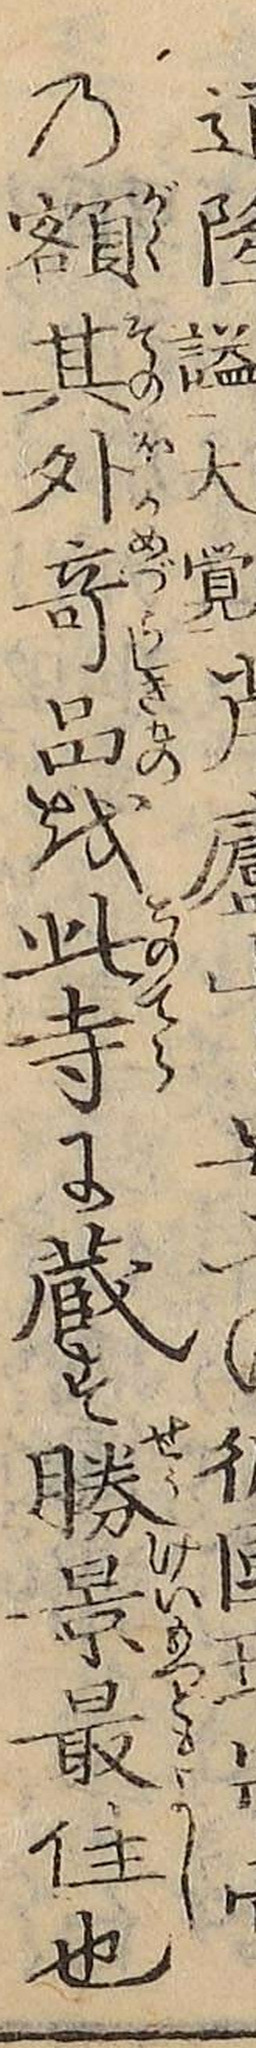の額其外奇品を此寺に蔵す勝景最佳也
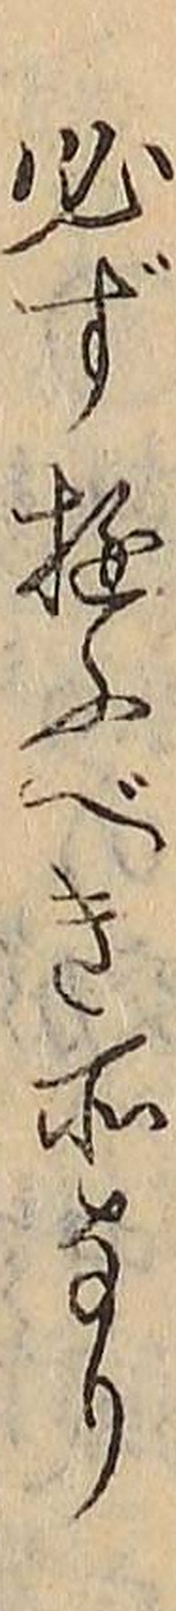必ず遊ふべき所なり
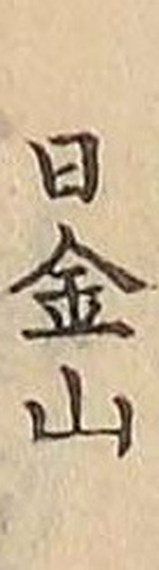日金山
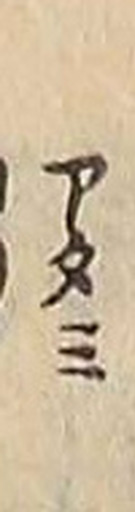アタミ
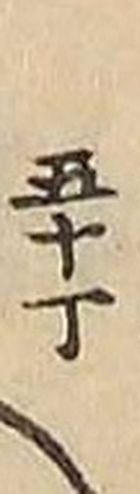五十丁
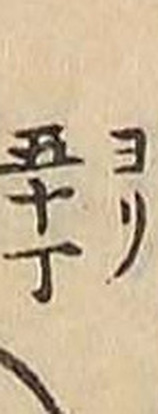五十丁
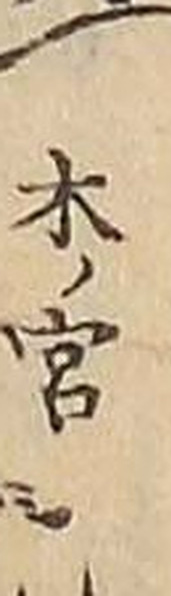木ノ宮

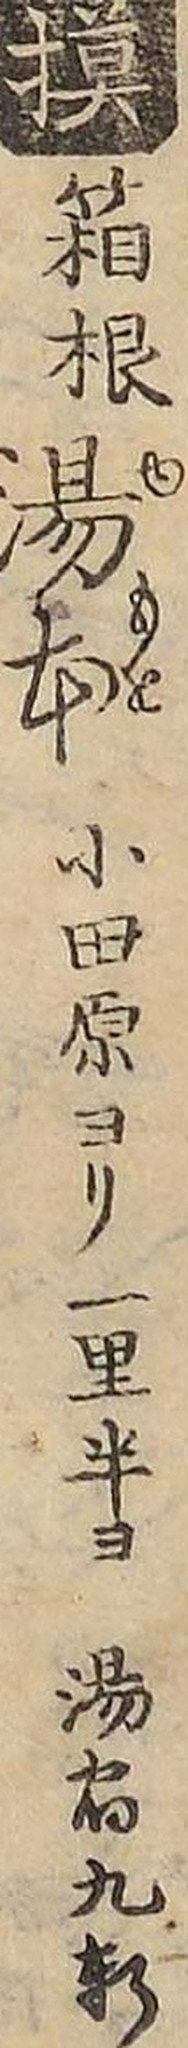相模箱根湯本小田原ヨリ一里半ヨ湯宿九軒
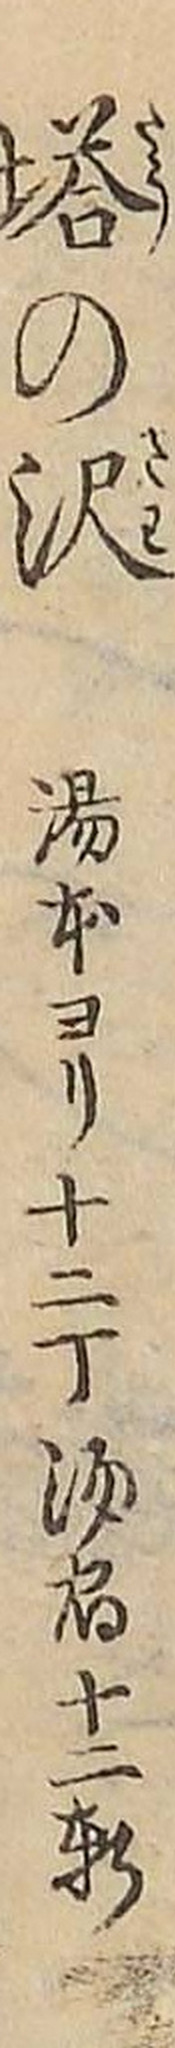塔の沢湯本ヨリ十二丁湯宿十二軒
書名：旅行用心集
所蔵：神戸大学附属図書館 国文学研究資料館
